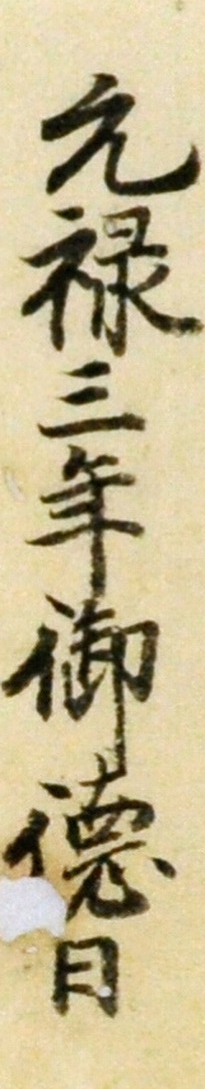元禄三年御徳日
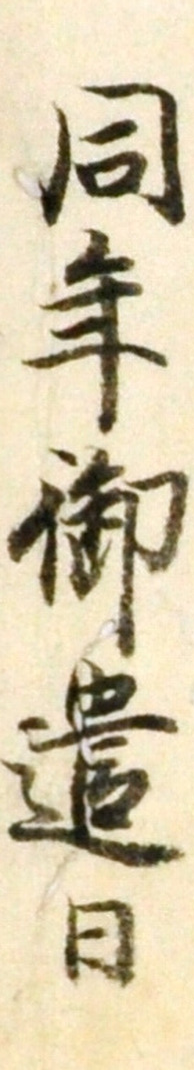同年御遣日
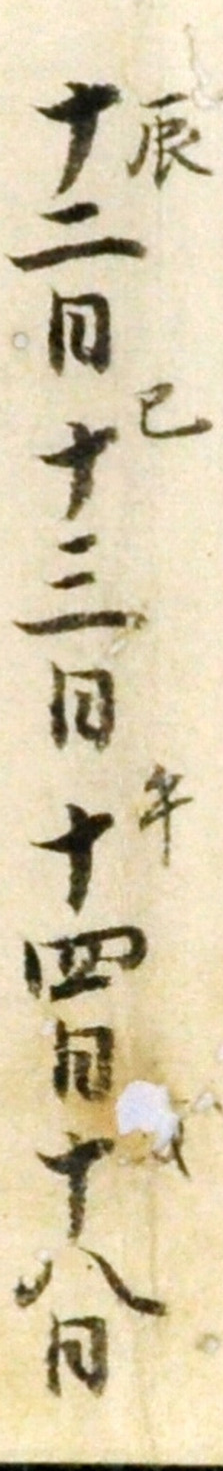十二日十三日十四日十八日
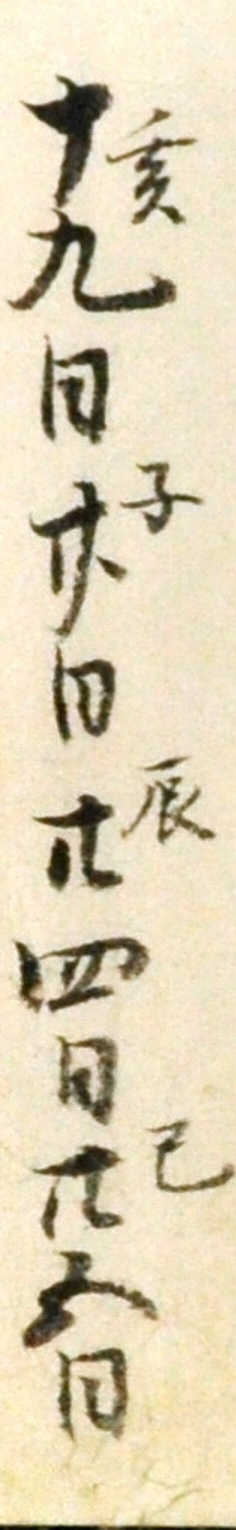十九日廿日廿四日廿五日

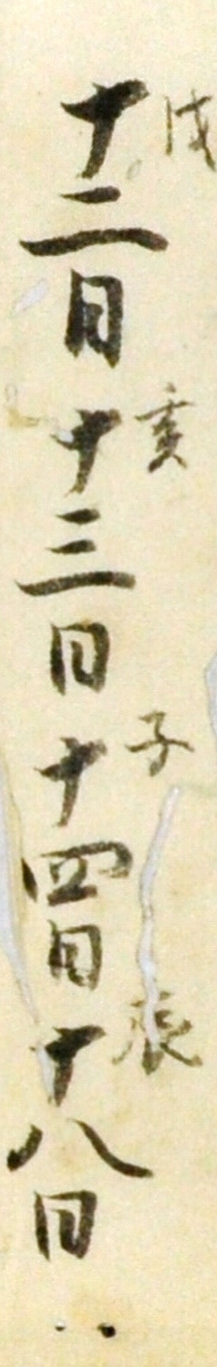十二日十三日十四日十八日
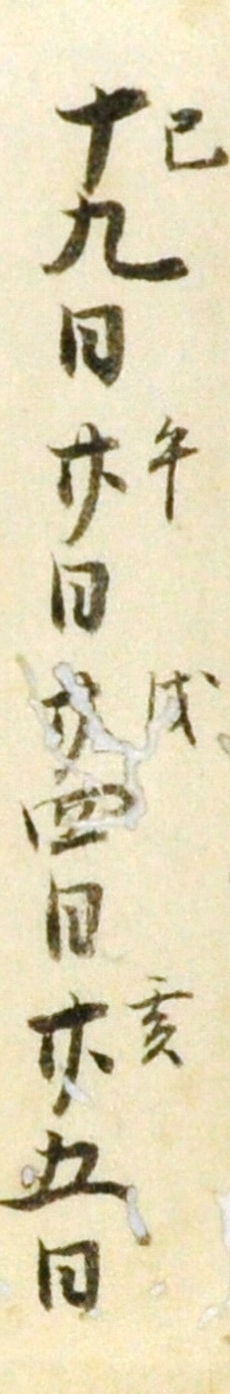十九日廿日廿四日廿五日
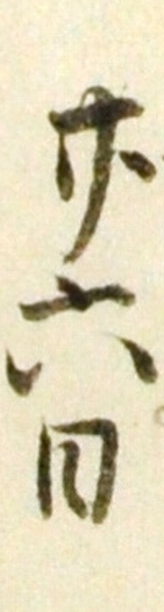廿六日
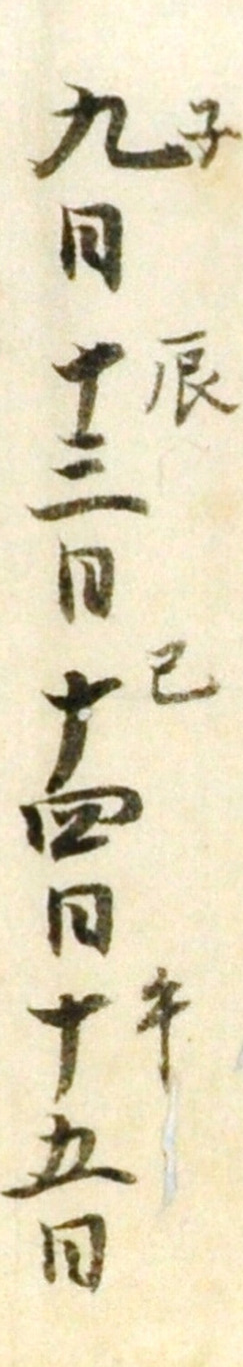九日十三日十四日十五日
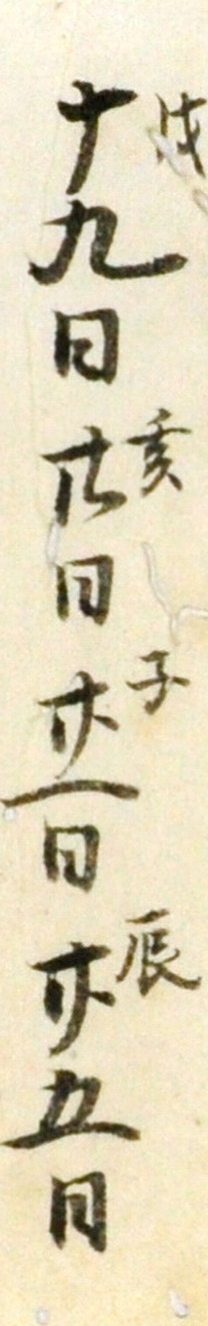十九日廿日廿一日廿五日
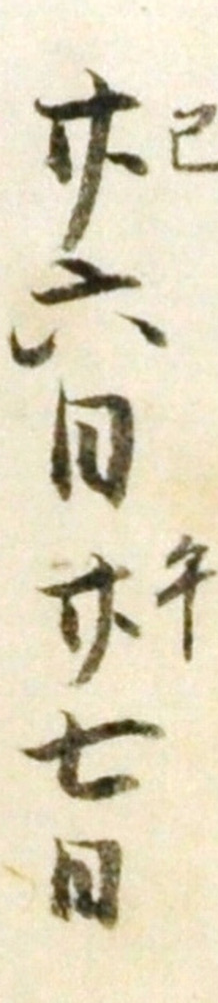廿六日廿七日
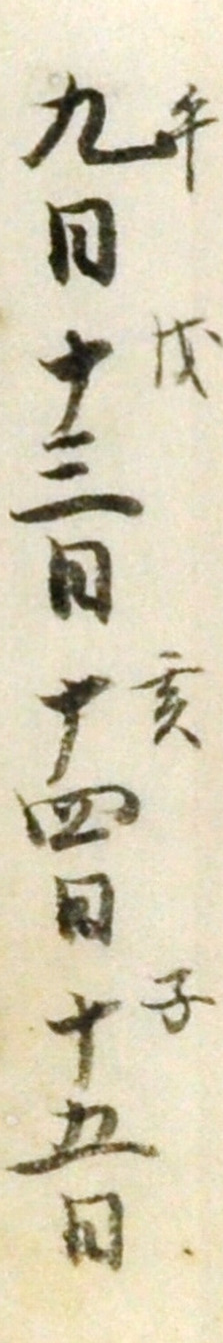九日十三日十四日十五日
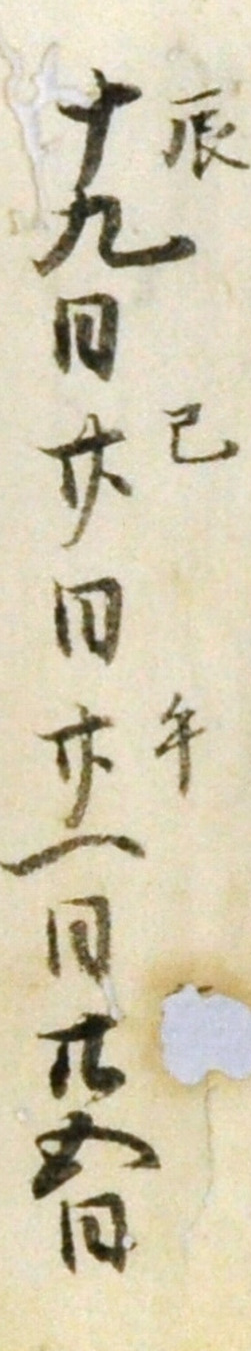十九日廿日廿一日廿五日
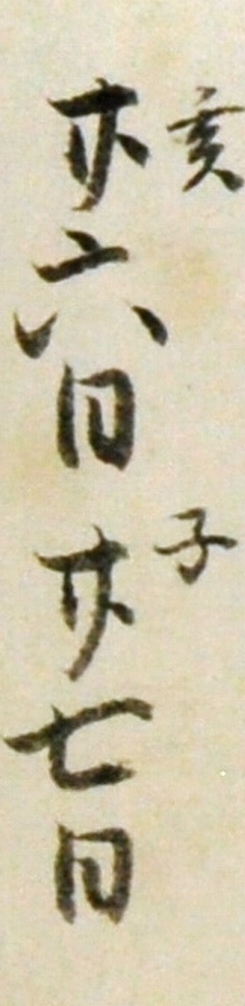廿六日廿七日

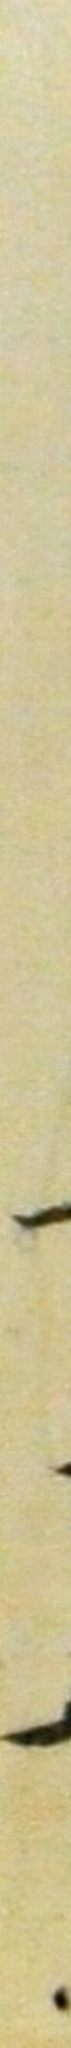十九日廿日廿一日廿五日
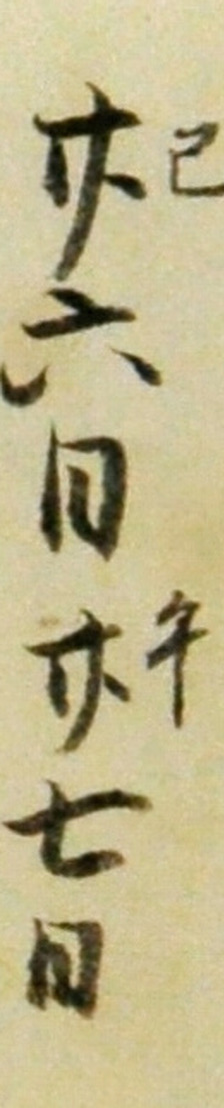廿六日廿七日
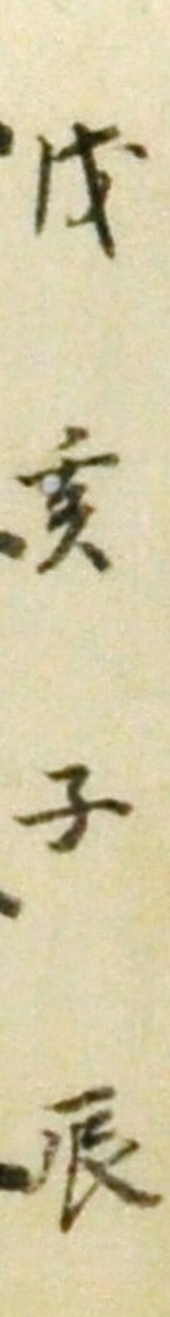戌亥子辰
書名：元禄三年御徳日書上
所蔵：伊那市立高遠町図書館・合同会社AMANE
